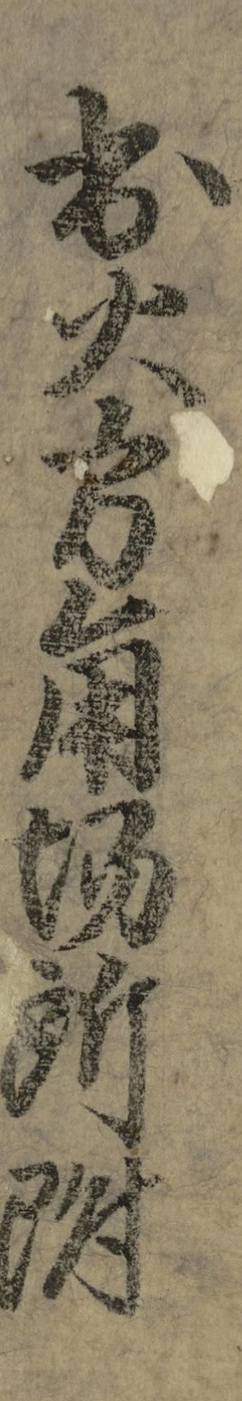出火方角場所附
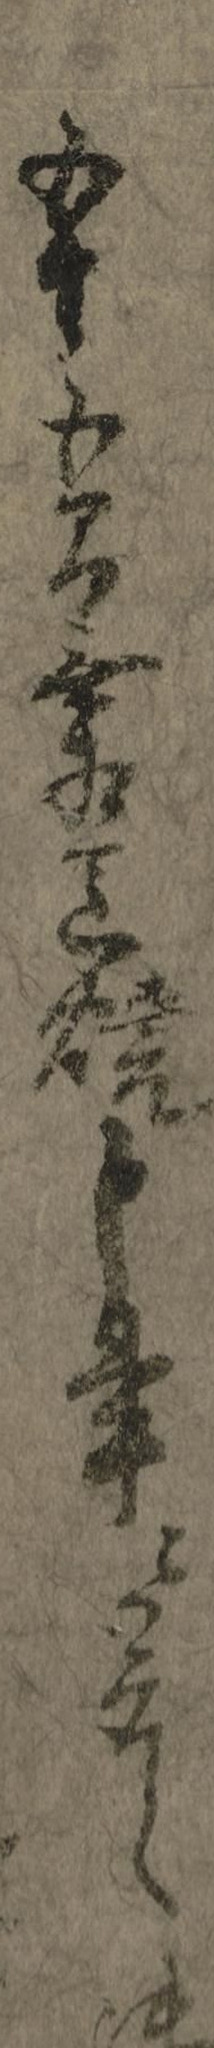五十五間無相違焼申事に御座候御
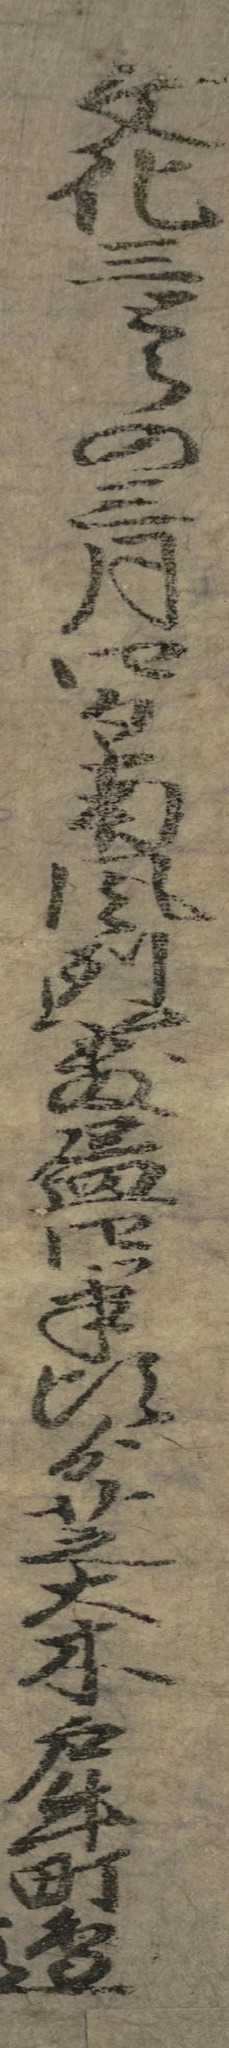文化三とらの三月四日南風烈敷昼四ツ半頃ゟ芝大木戸牛込町辺
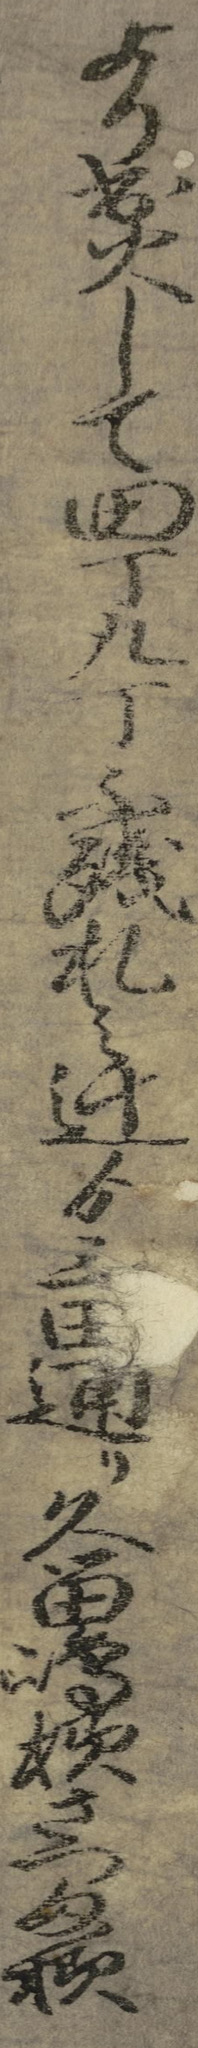より出火して田丁九丁不残札之辻ゟ三田通り久留嶋様さつま様
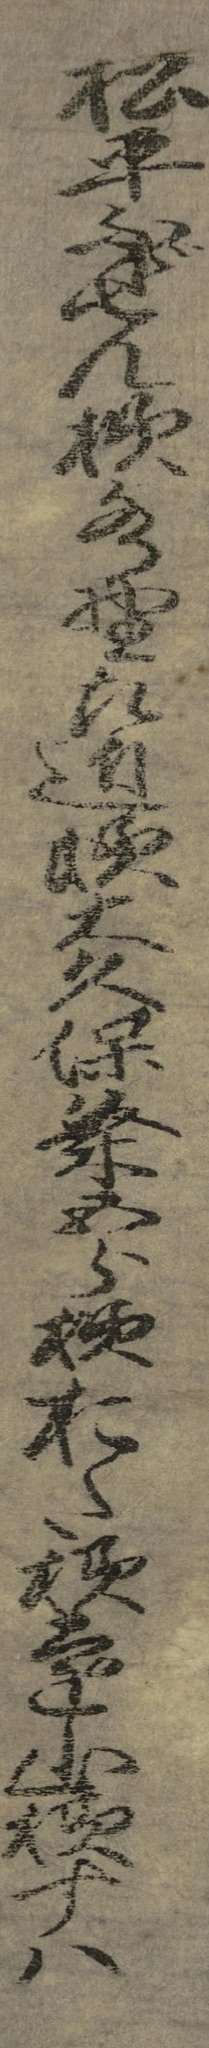松平ふぜん様水野左近様大久保粂五郎様おた様遠山様すは
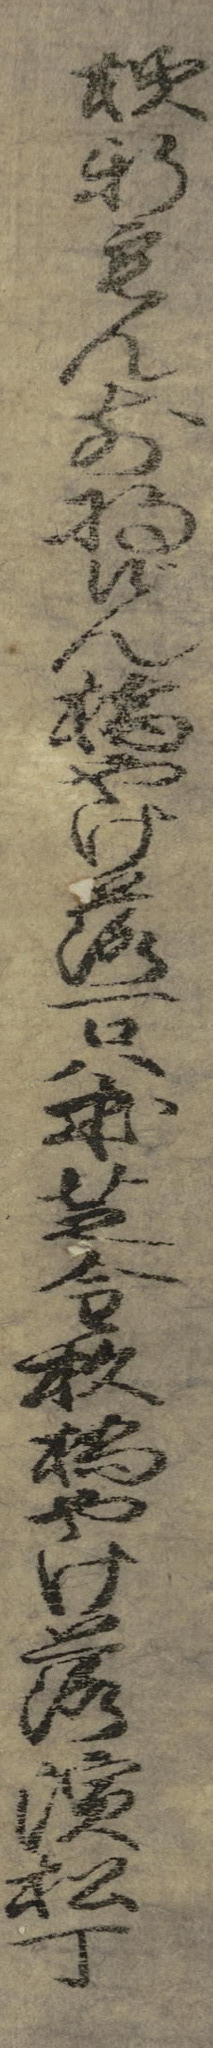様新もん前将げん橋やけ落一口は本芝金杉橋やけ落濱松丁
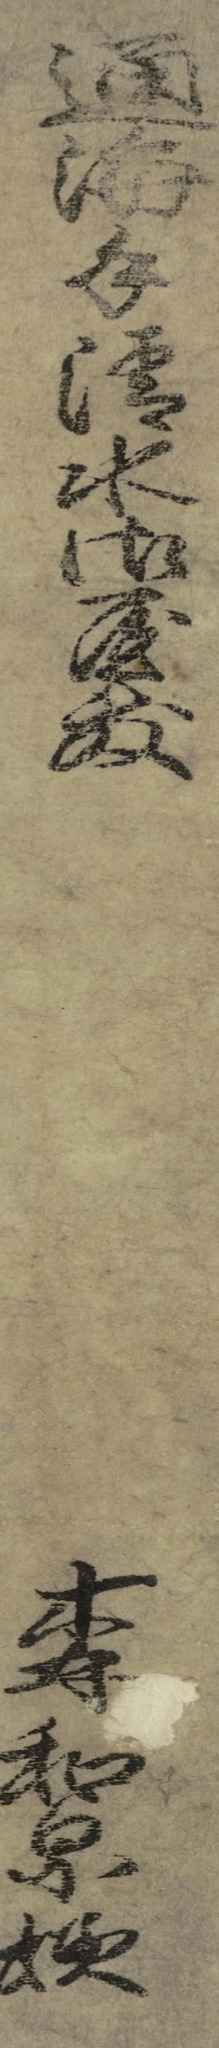通海手清水御屋敷森和泉様
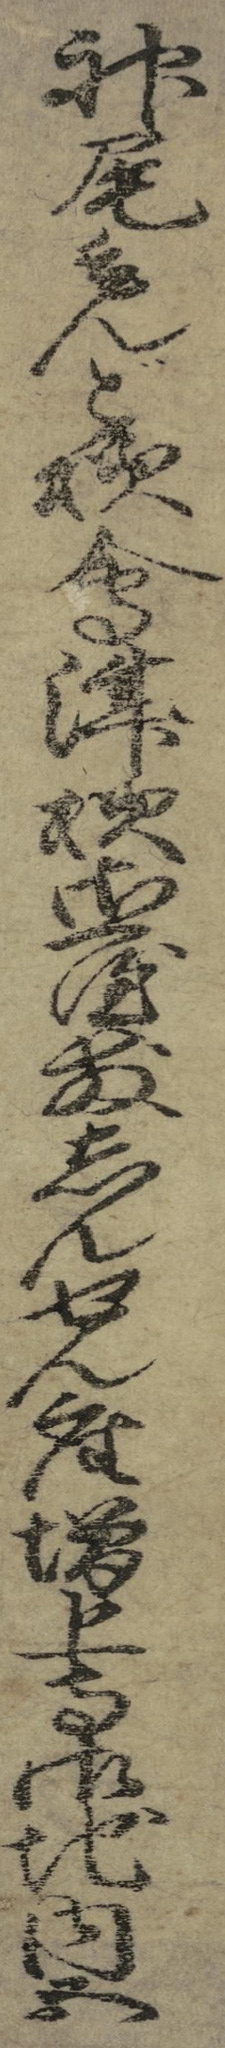神尾もんど様会津様御屋敷しんせん座増上寺御地内五
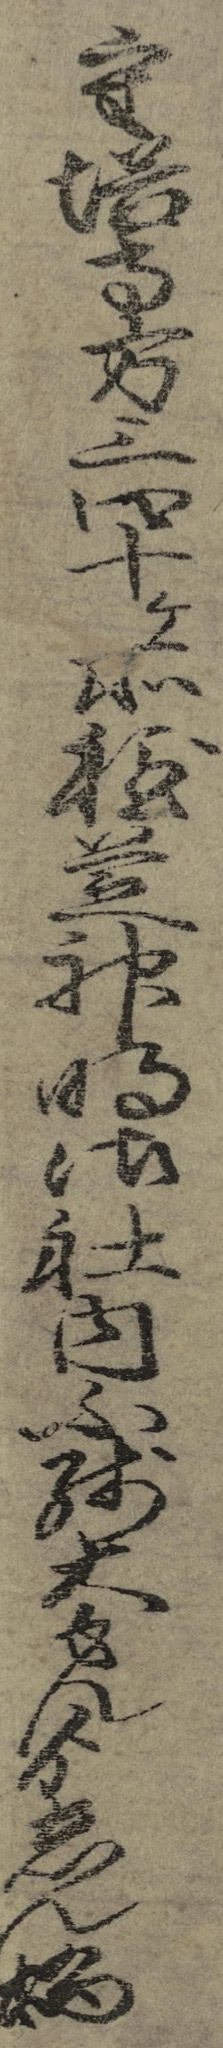重塔寺方三四十ケ所程芝神明御社内不残大もんゟしん橋
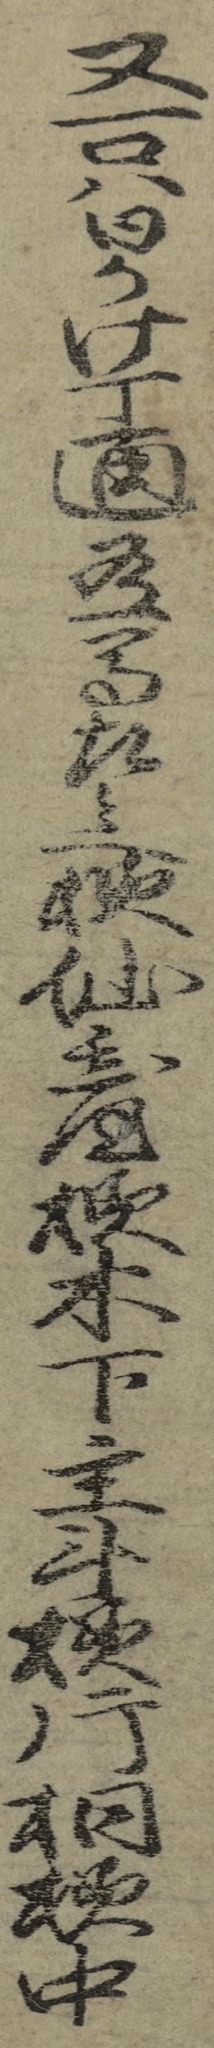又一口は日かけ丁通有馬左兵へ様仙台様木下主計様片桐様中
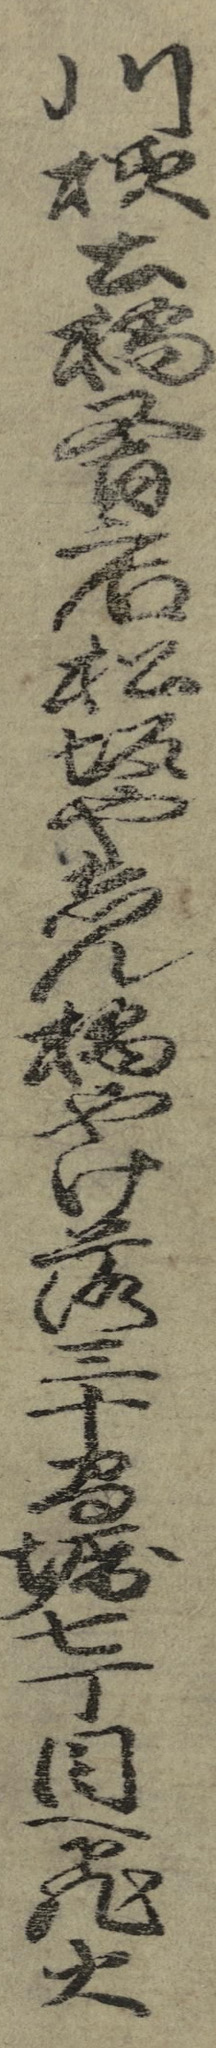川様土橋肴店松坂やしん橋やけ落三十間堀七丁目へ飛火
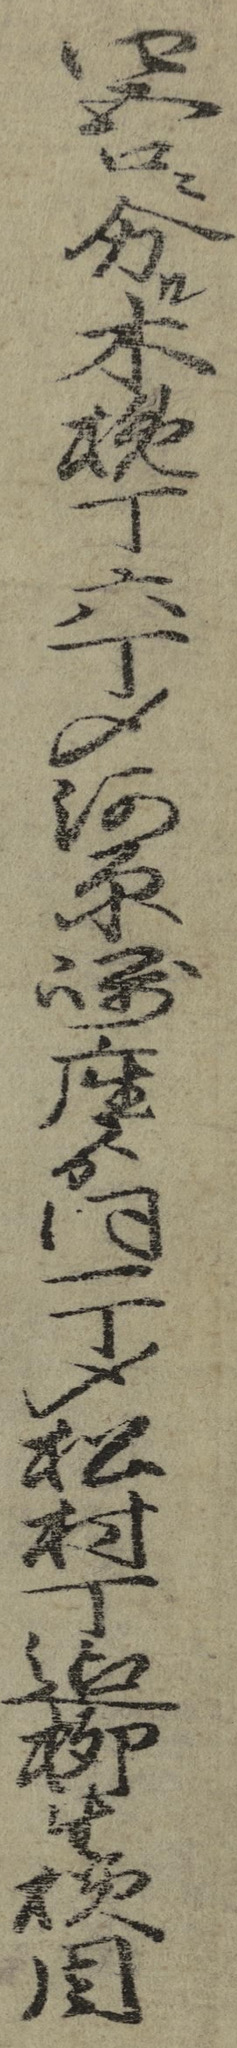四五口に分ル木挽丁六丁メ河原崎座ゟ同一丁メ松村丁迄柳生様周
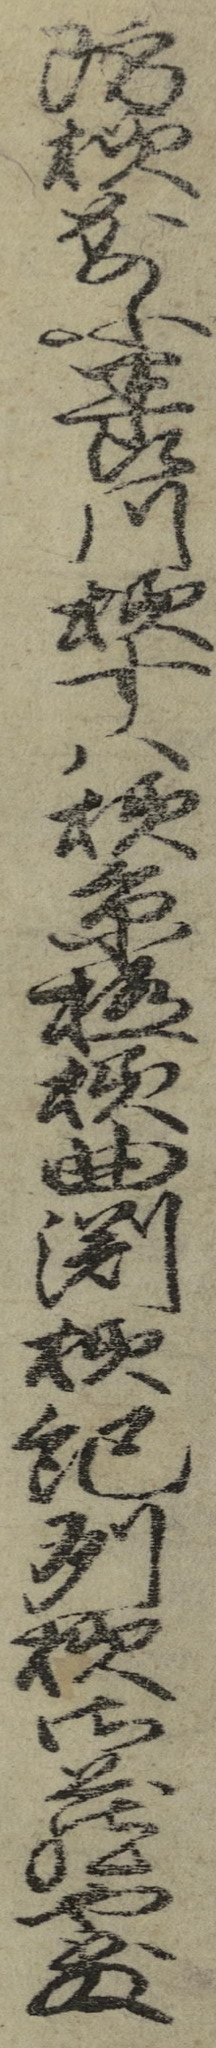防様かのふ養川様すは様京極様曲渕様紀州様御蔵や敷
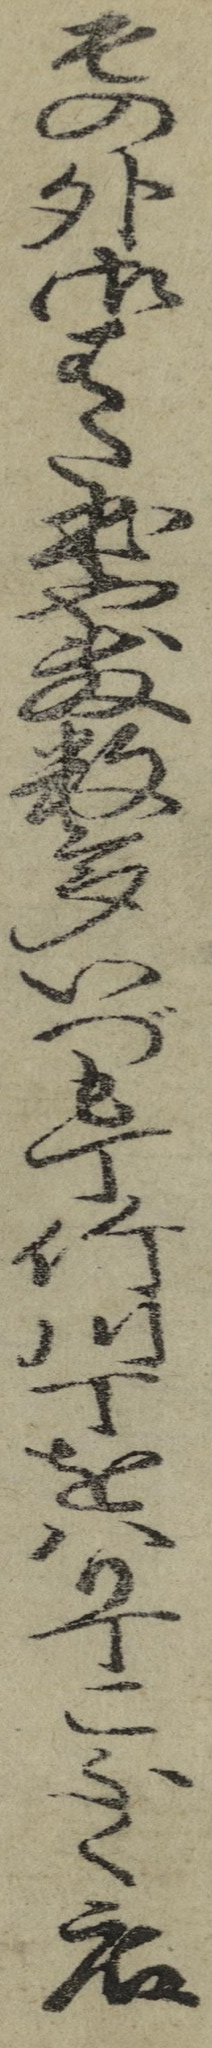その外御はた本や敷数多いづも丁竹川丁をはり丁こふく店
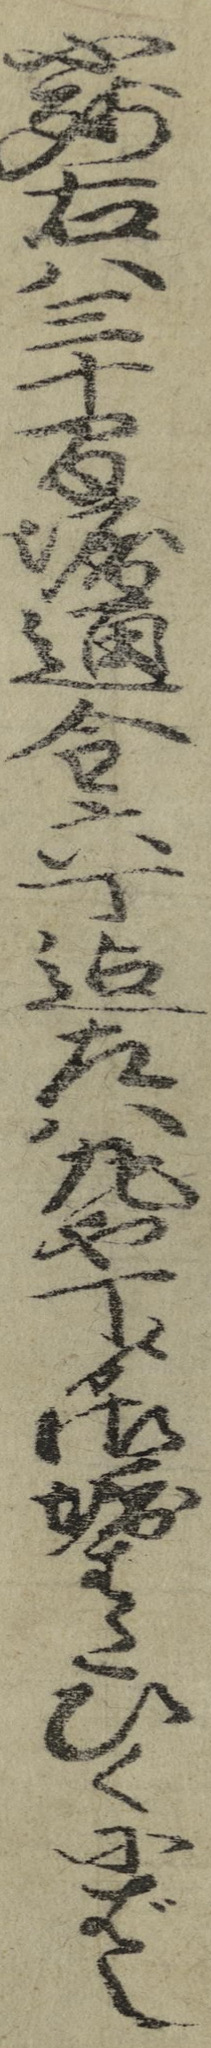不残右は三十間堀通全六丁迄左は丸や丁ゟ御堀はたひくにばし
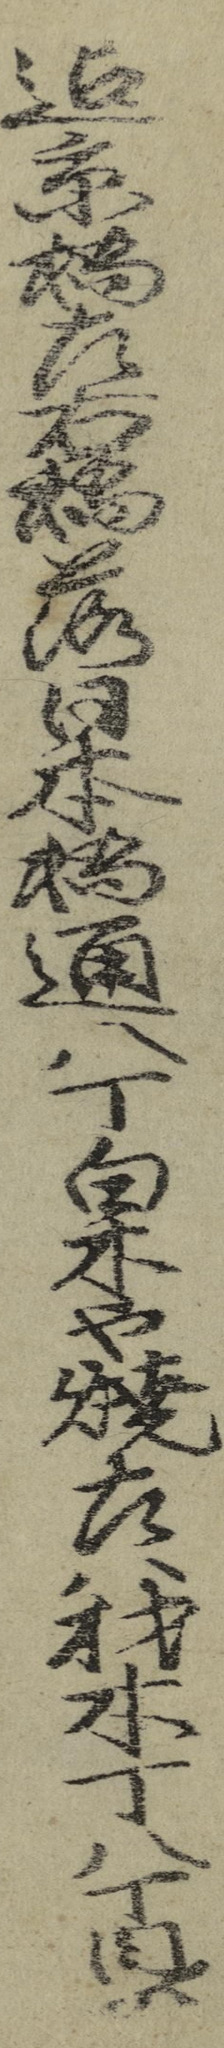迄京橋左右橋落日本橋通八丁白木や焼左は材木丁八丁目ゟ
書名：出火方角場所附
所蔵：東京大学地震研究所図書室 Earthquake Research Institute Library, The University of Tokyo, JAPAN
